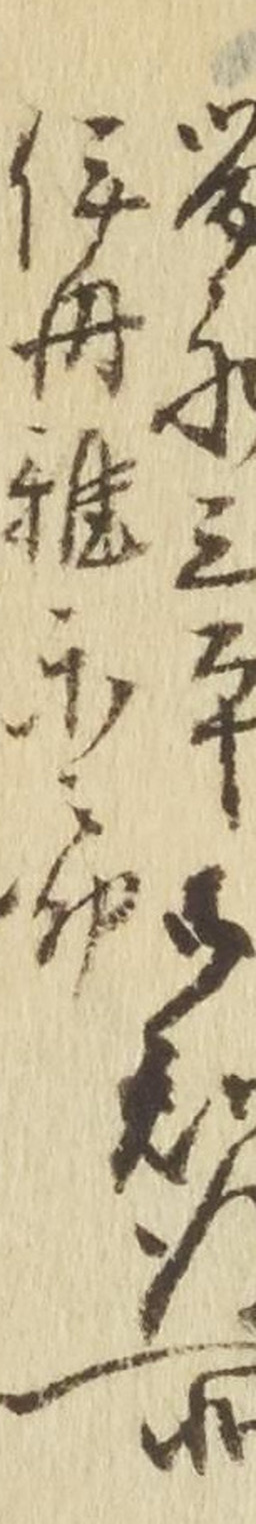伊丹雅楽之助
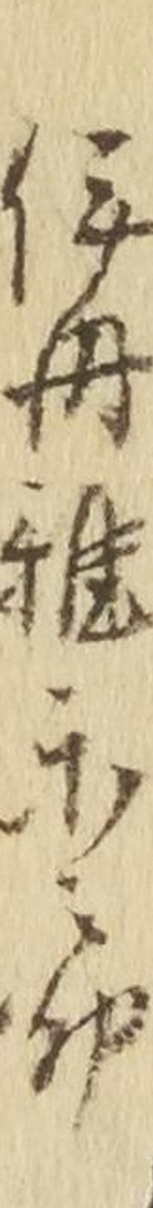伊丹雅楽之助
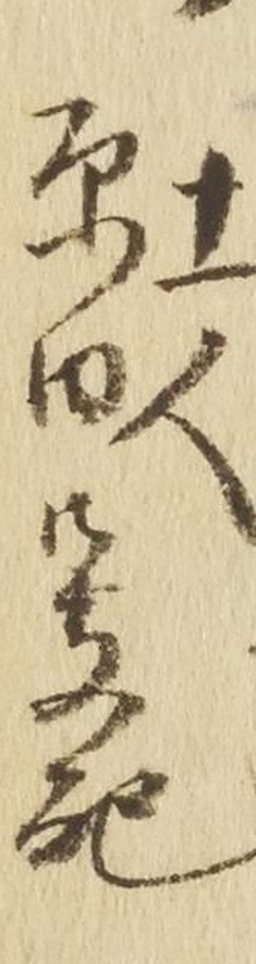原田御支配
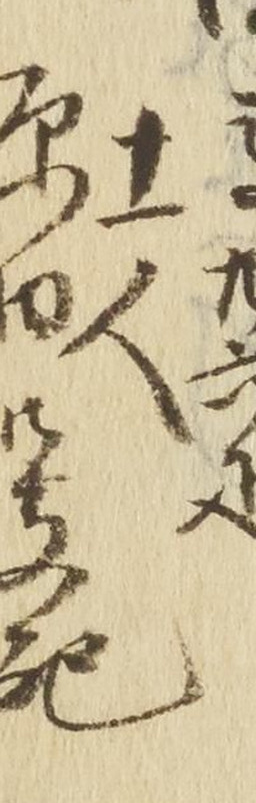原田御支配
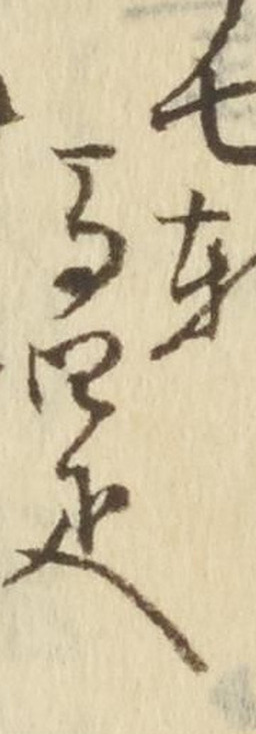馬六疋
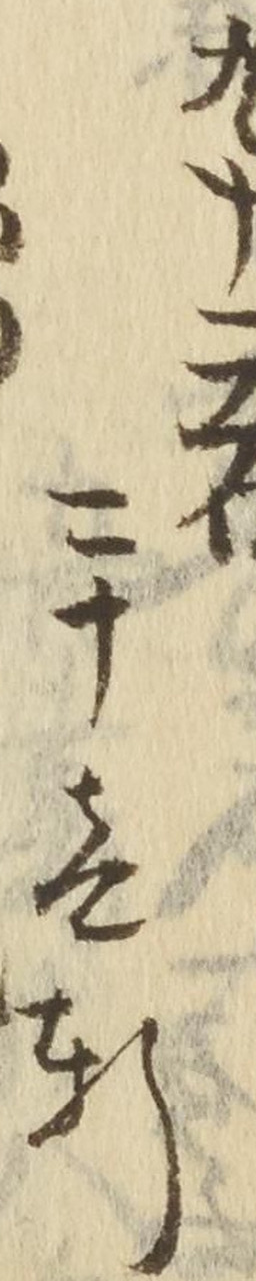二十壱軒
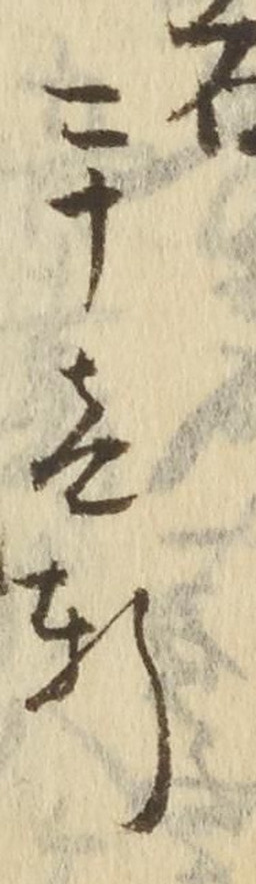二十壱軒
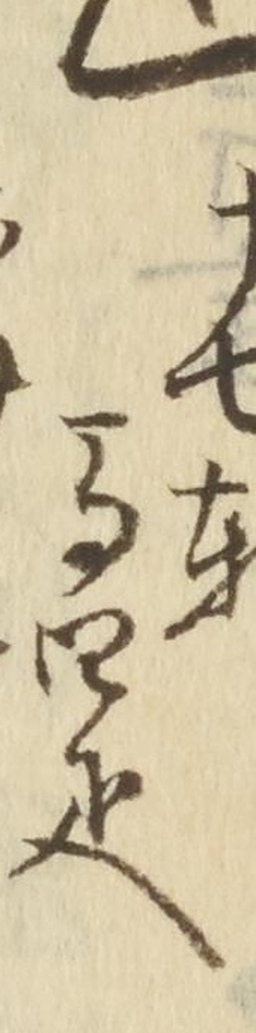馬六疋
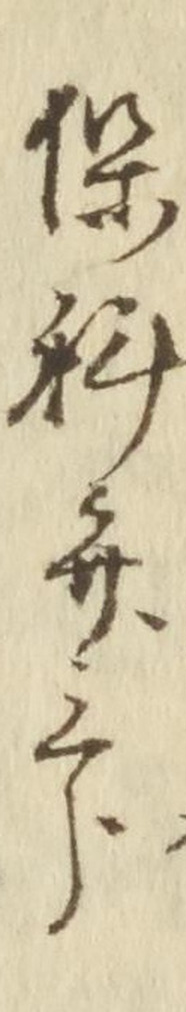保科弁三郎
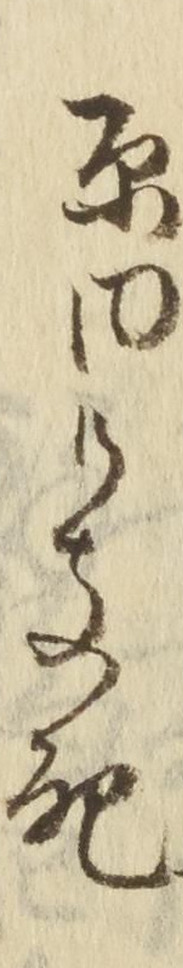原田御支配
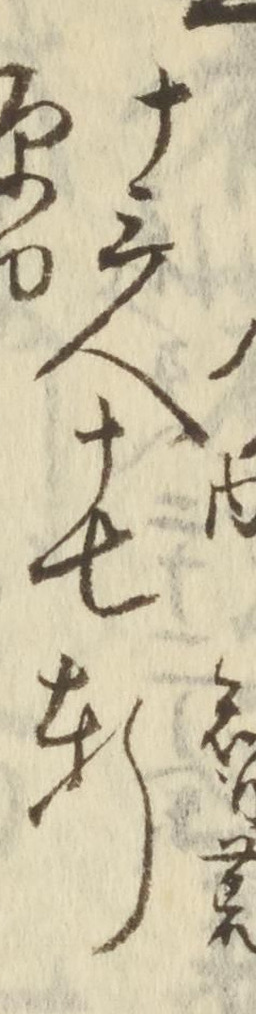十三人十七軒
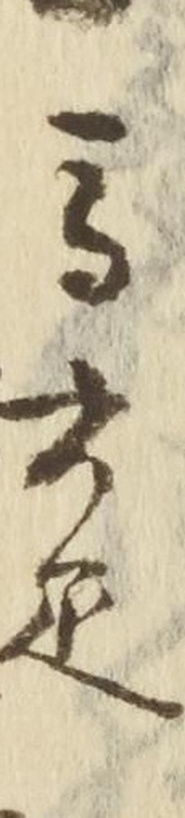馬六疋
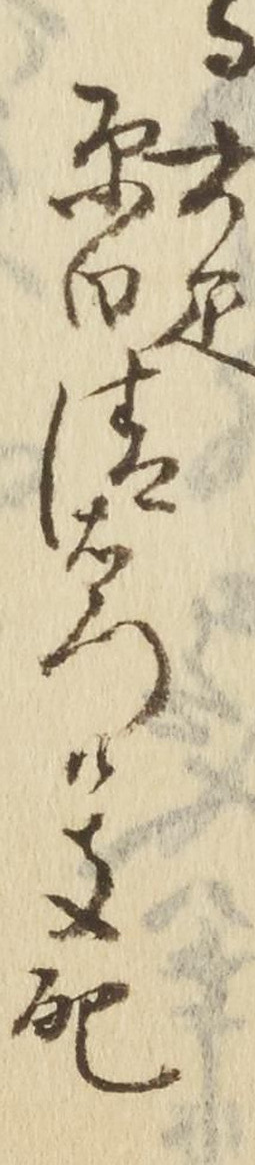原田清右衛門御支配
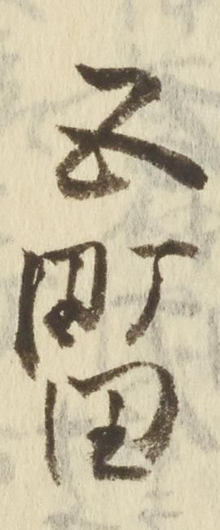五町田
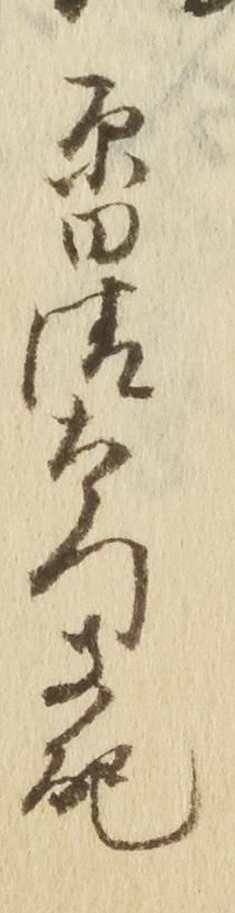原田清右衛門氏支配
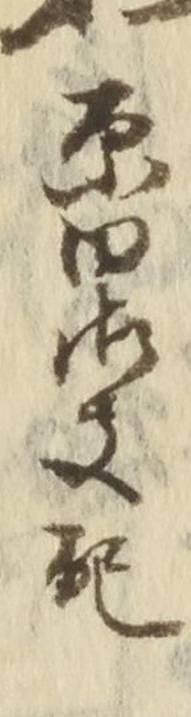原田御支配
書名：浅間大變記
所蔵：東京大学地震研究所図書室 Earthquake Research Institute Library, The University of Tokyo, JAPAN
